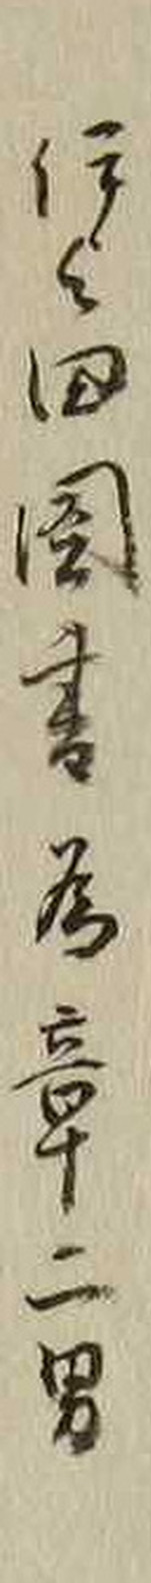伊与田図書為章二男
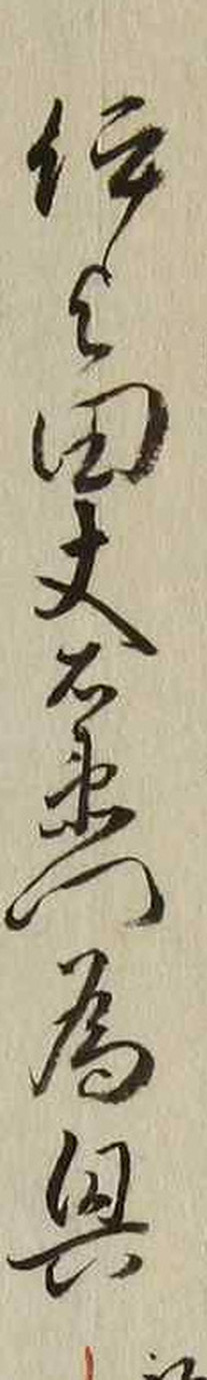伊与田丈右衛門為興
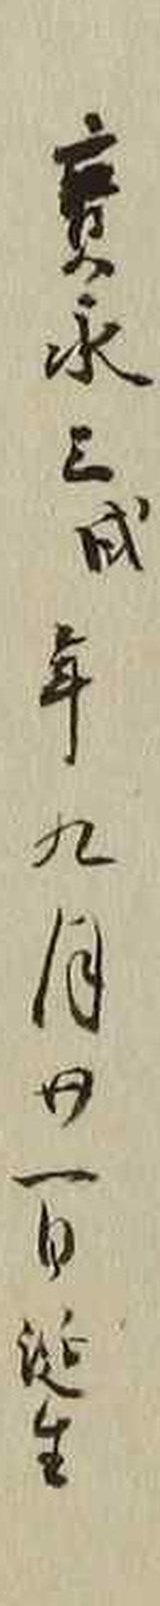寶永三戌年九月廿一日誕生
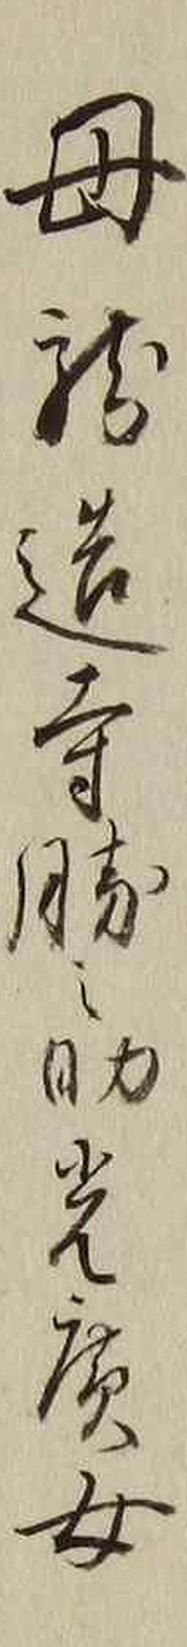母龍造寺勝之助光廣女
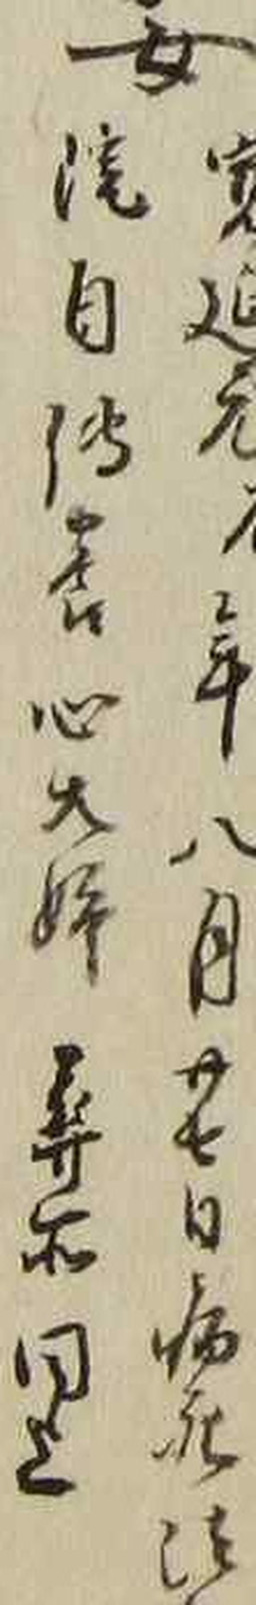院自伝養心大姉葬所同上

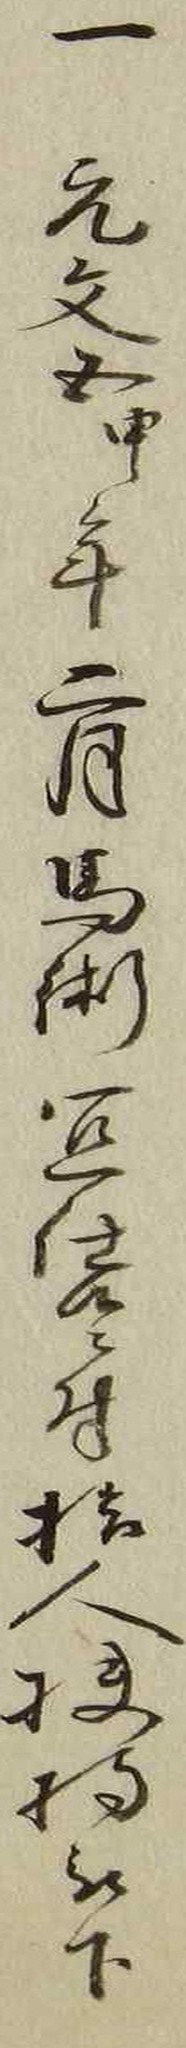一元文五申年二月馬術宜仕候ニ付拾人扶持被下
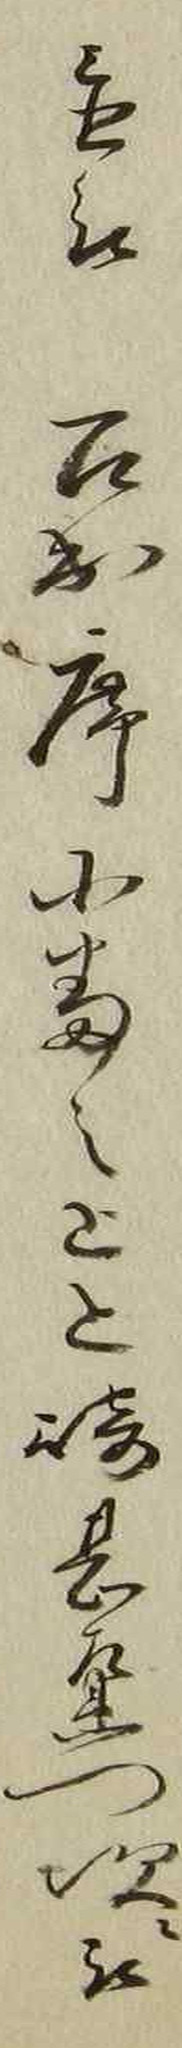置被召出席小番之上上崎甚左衛門次ニ被
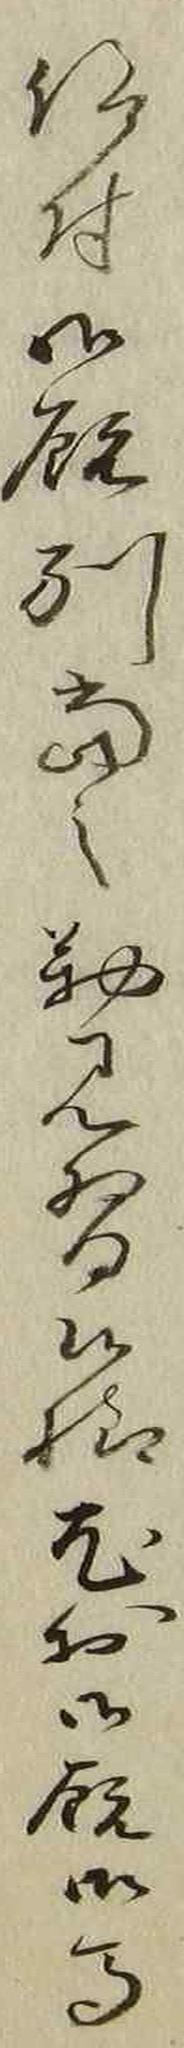仰付御厩別当之勤見習候様尤於御厩御馬
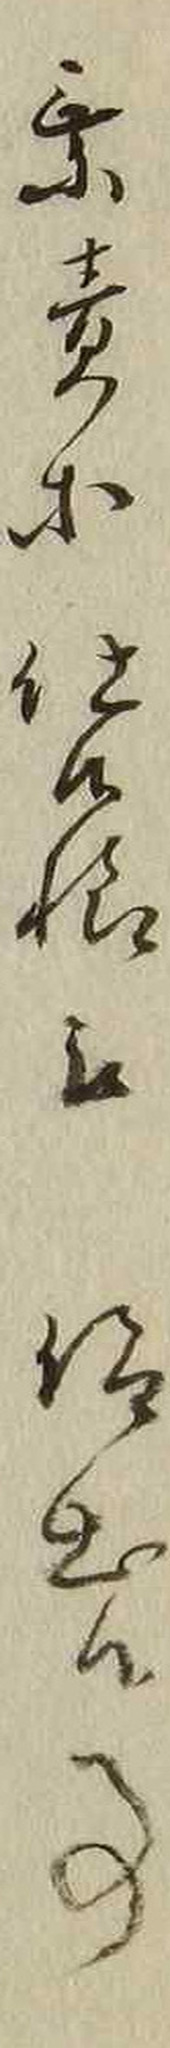乗責等仕候様被仰出候事
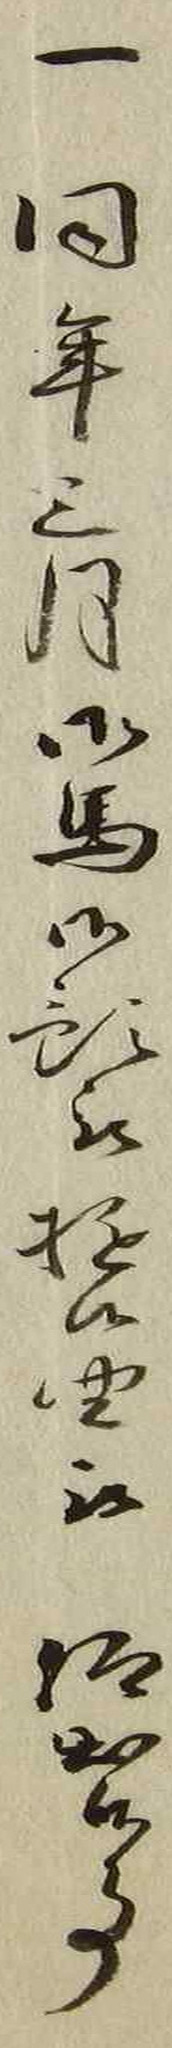一同年三月御馬御預被遊候由被仰出候事
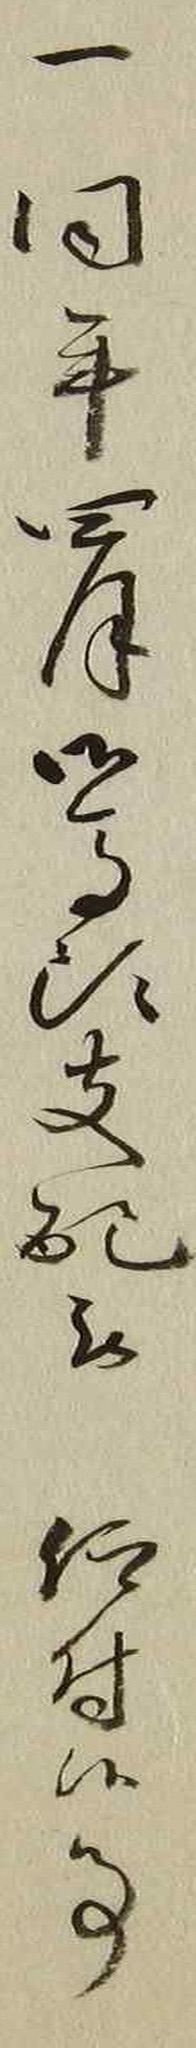一同年四月御馬頭支配被仰付候事
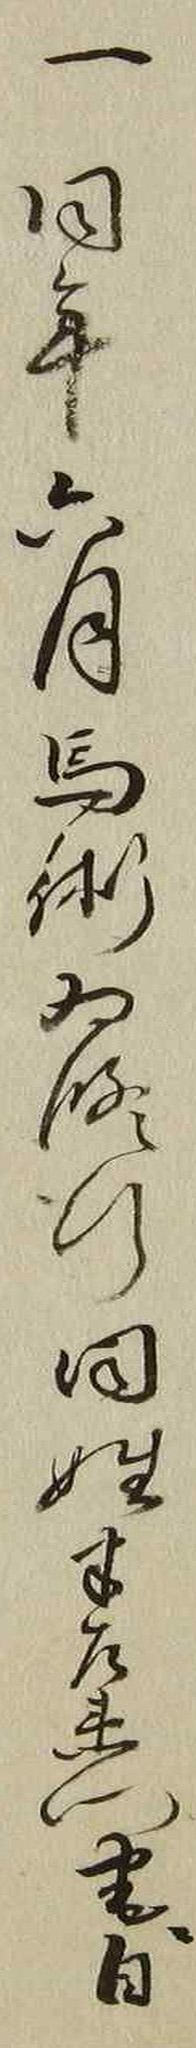一同年六月馬術為修行同姓半左衛門宅ニ自
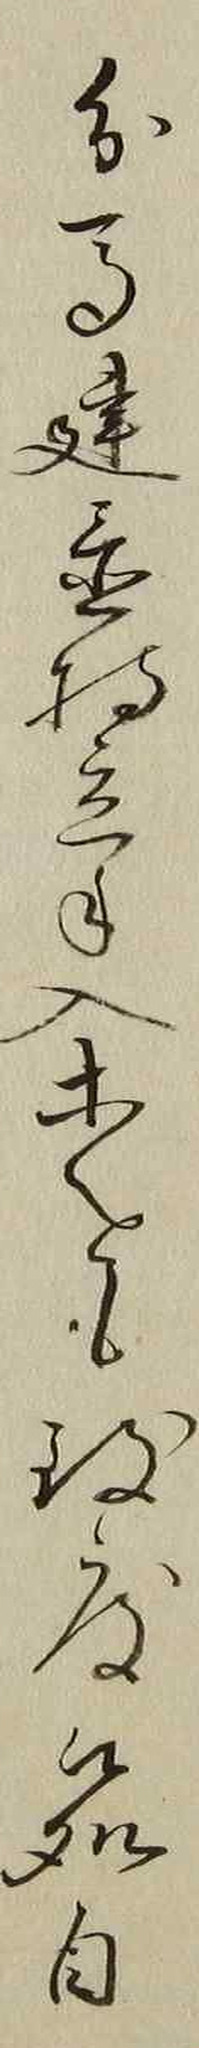分馬建置持立手入等をも致度候処自
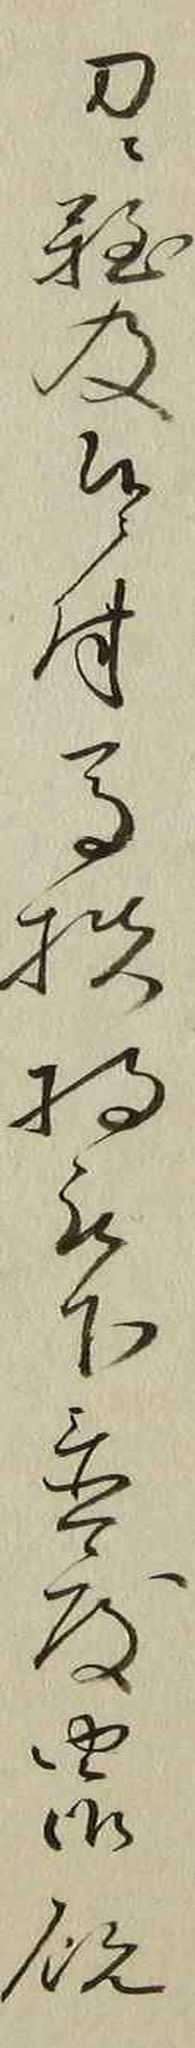刀ニ難及候ニ付馬扶持被下置度由御厩
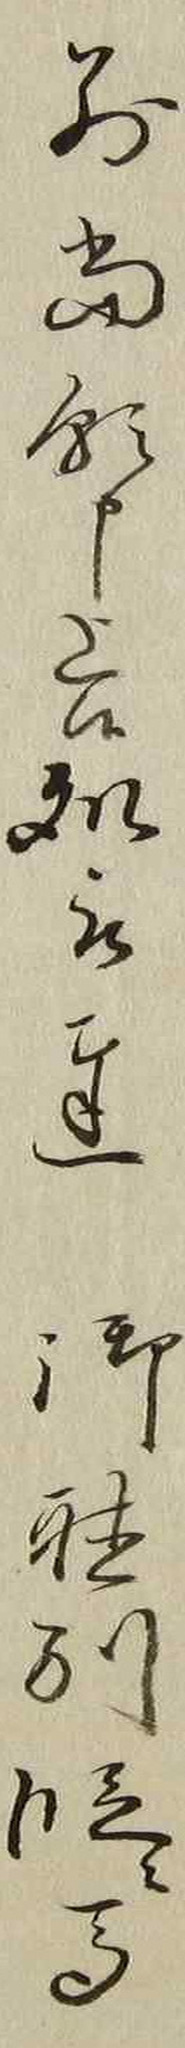別当願申上候処被達御聴別段ニ馬
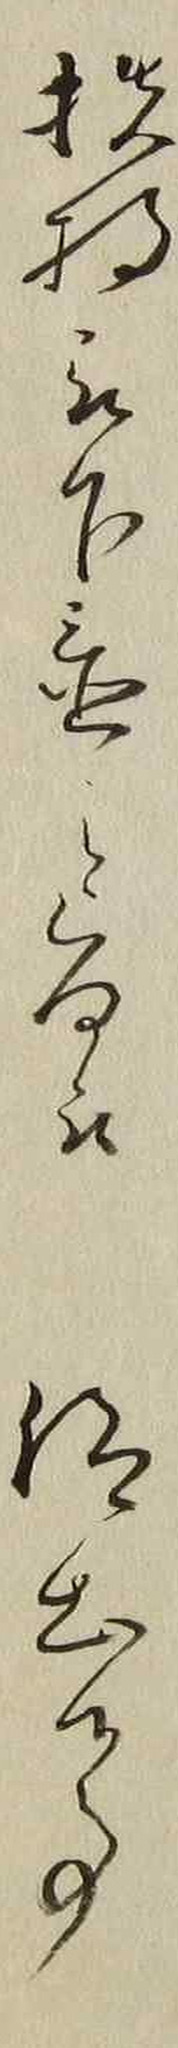扶持被下置候旨被仰出候事
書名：諸士系譜　巻之3　い之部3
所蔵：会津若松市立会津図書館
